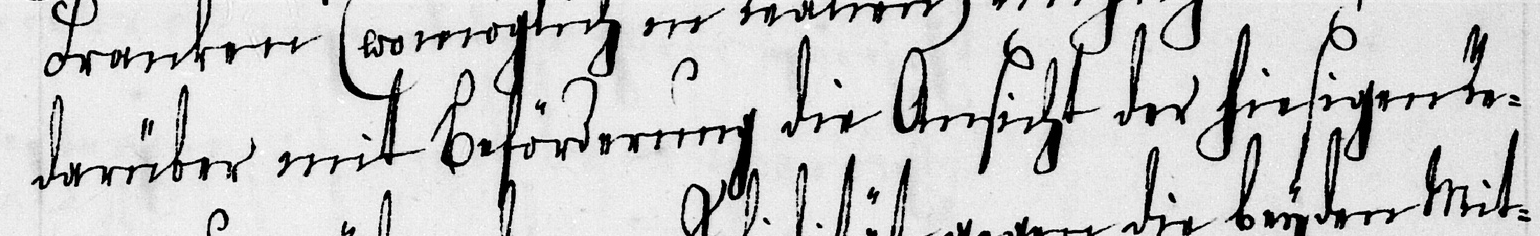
darüber mit Beförderung die Ansicht der hiesigen Re¬
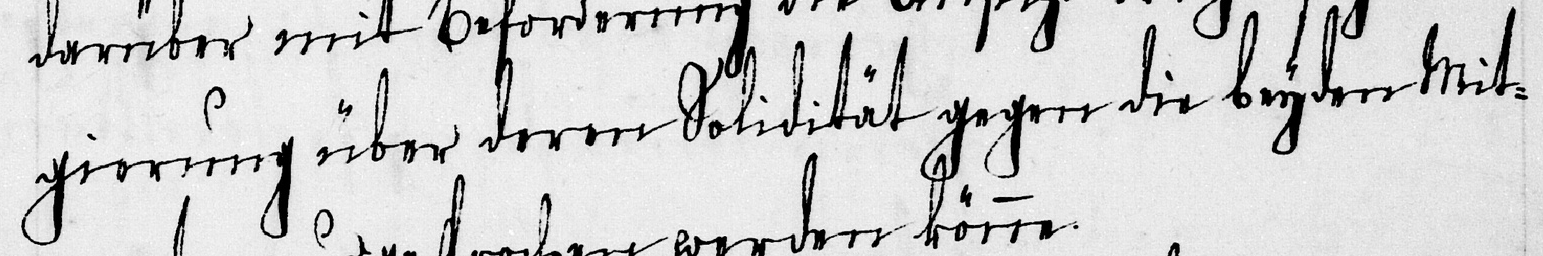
gierung über deren Solidität gegen die beyden Mit¬
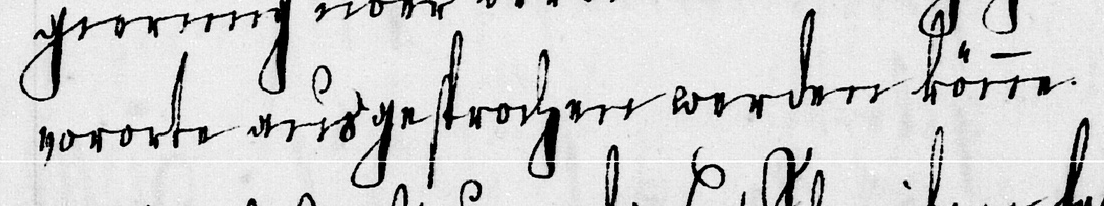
vororte ausgesprochen werden könne.
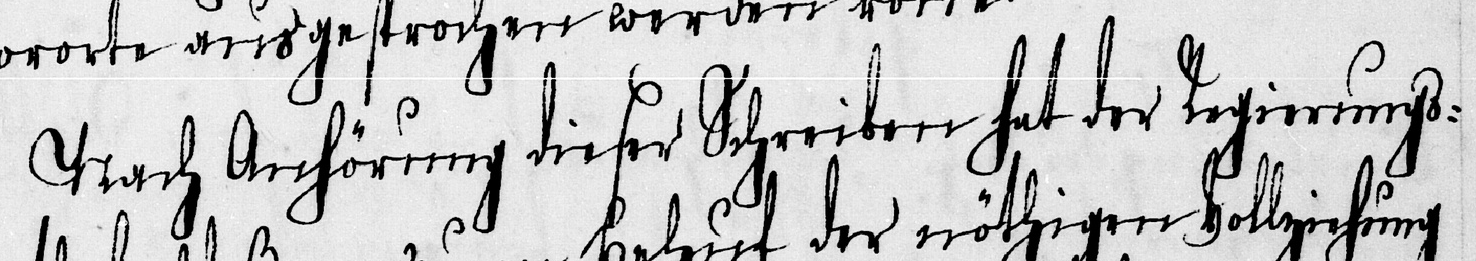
Nach Anhörung dieser Schreiben hat der Regierungs¬
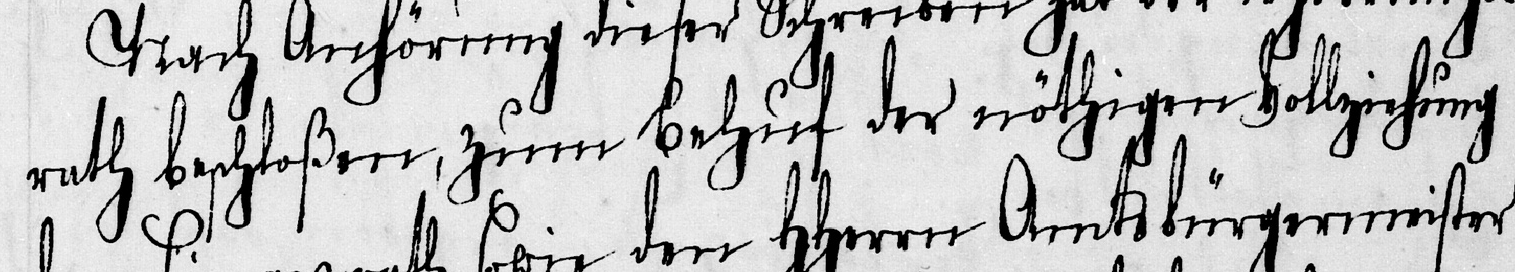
rath beschloßen, zum Behuf der nöthigen Vollziehung
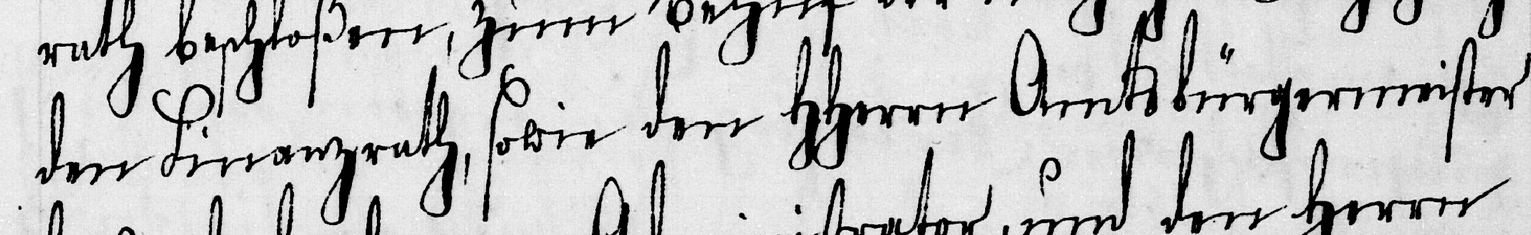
den Finanzrath, sowie den HHerrn Amtsbürgermeister
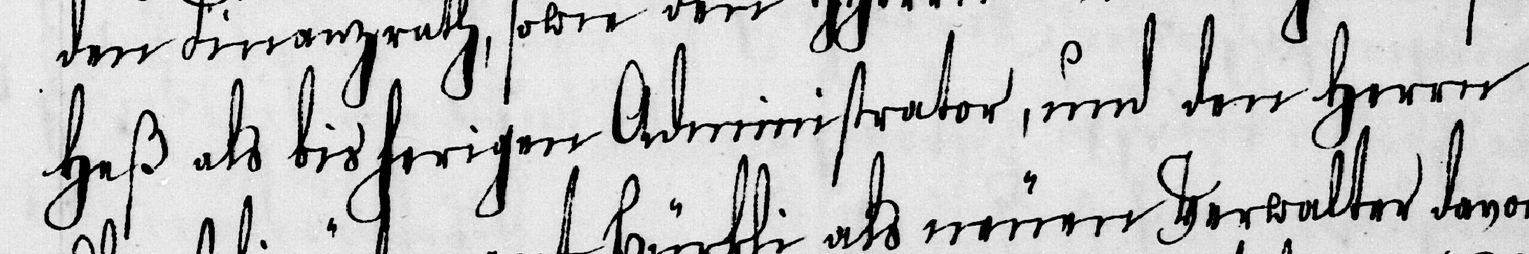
Heß als bisherigen Administrator, und den Herrn
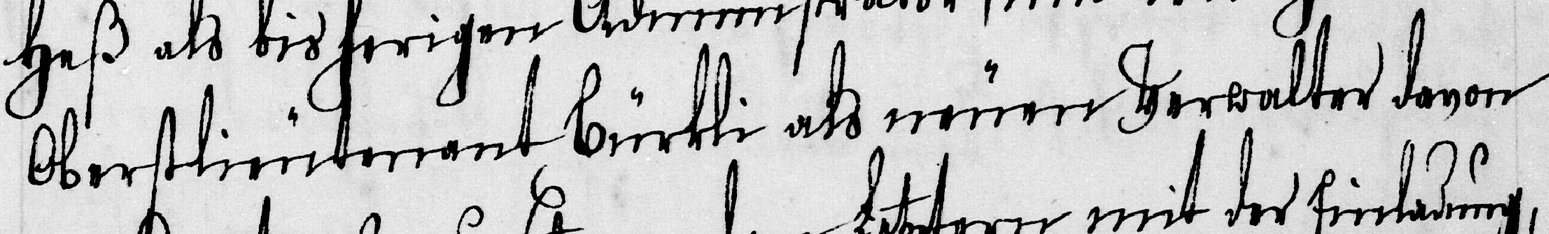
Oberstlieutenant Bürkli als neuen Verwalter davon
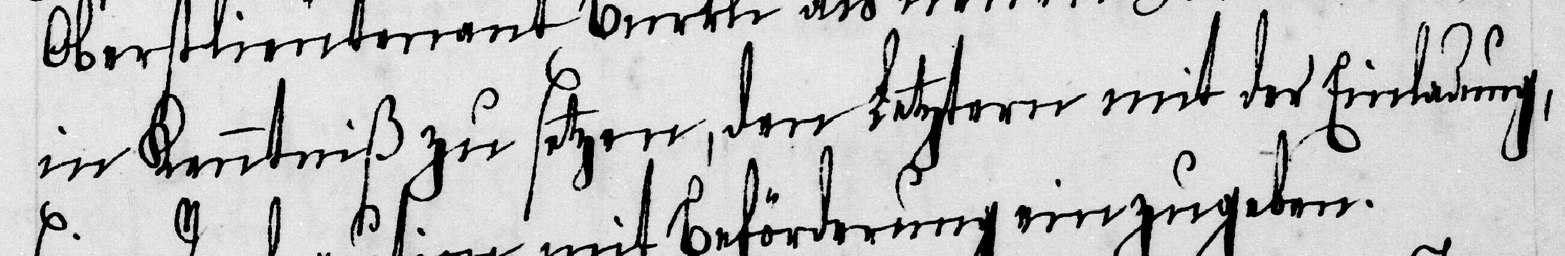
in Kenntniß zu setzen, den Letztern mit der Einladung,
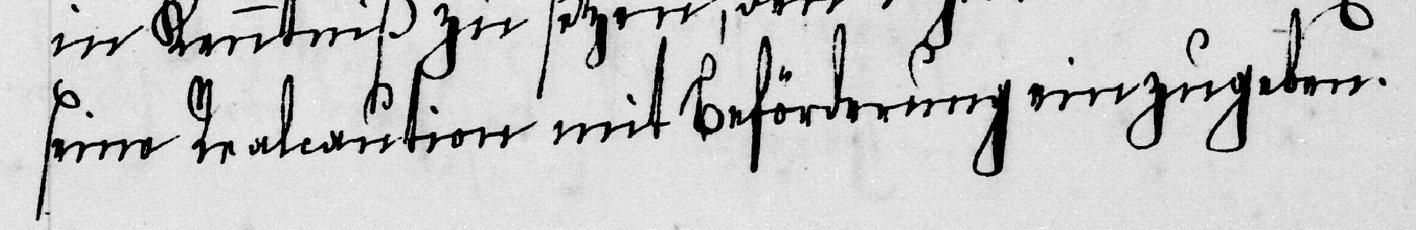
seine Realcaution mit Beförderung einzugeben.
